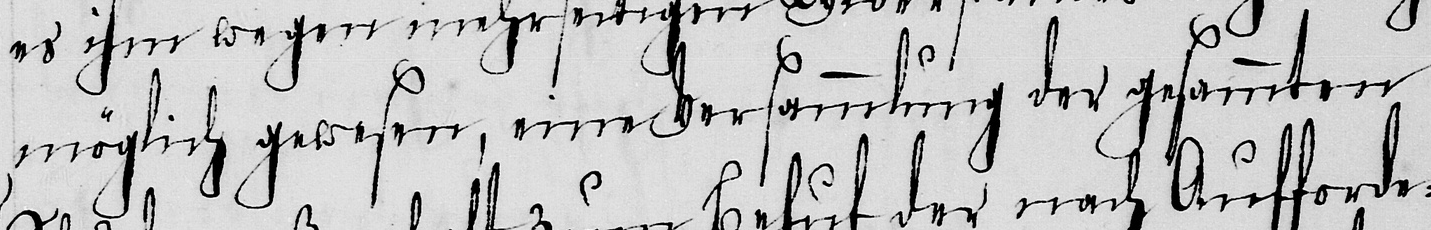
möglich gewesen, eine Versammlung der gesammten
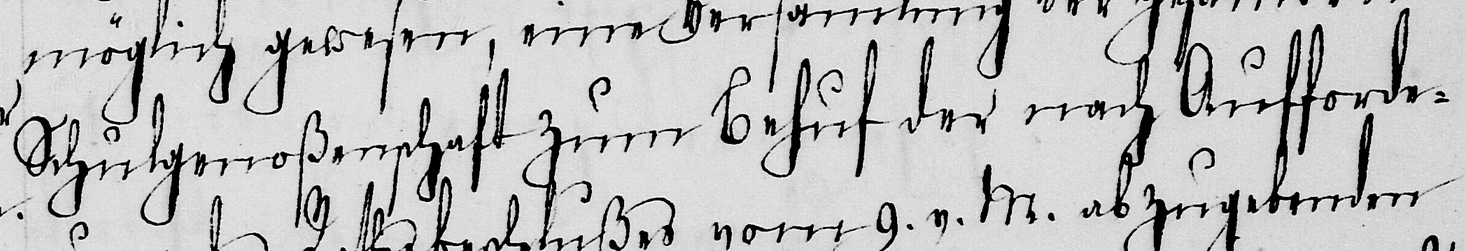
Schulgenoßen zum Behuf der nach Aufforde¬
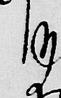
1.
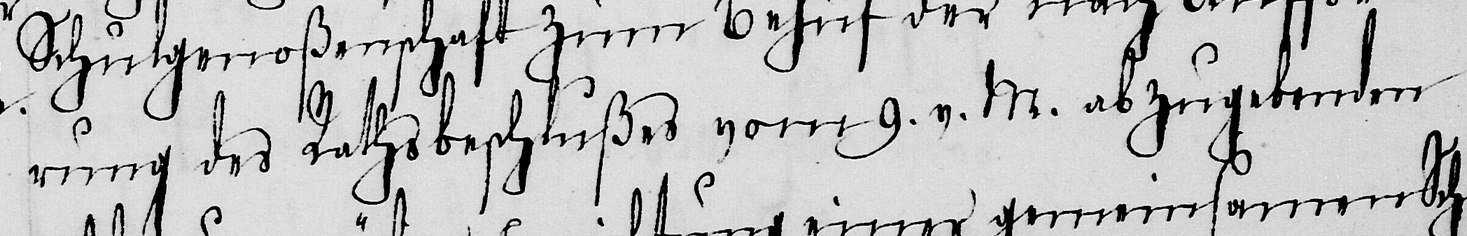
rung des Rathsbeschlußes vom 9. v. M. abzugebenden
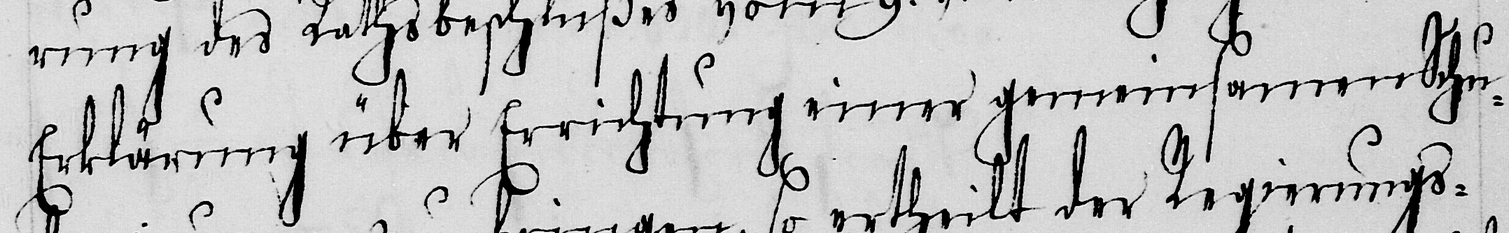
Erklärung über Errichtung einer gemeinsamen Schu¬
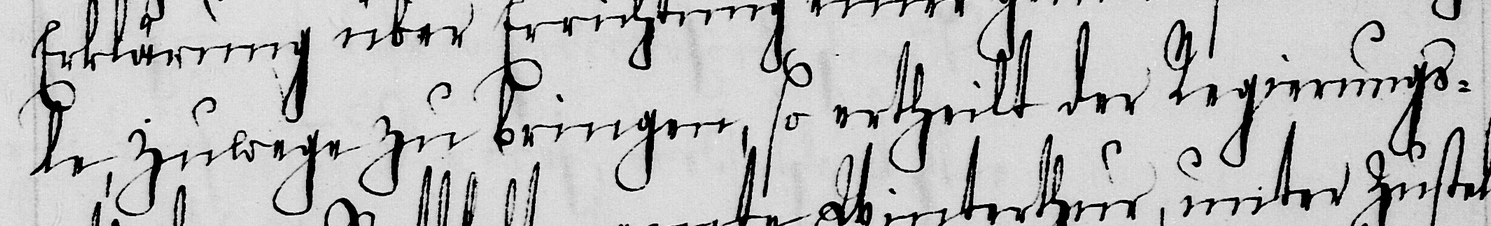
le, zuwege zu bringen, so ertheilt der Regierungs¬
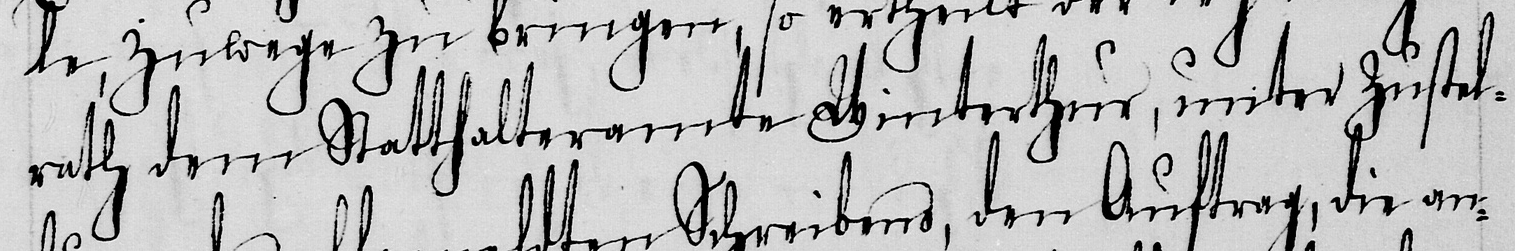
rath dem Statthalteramte Winterthur, unter Zustel¬
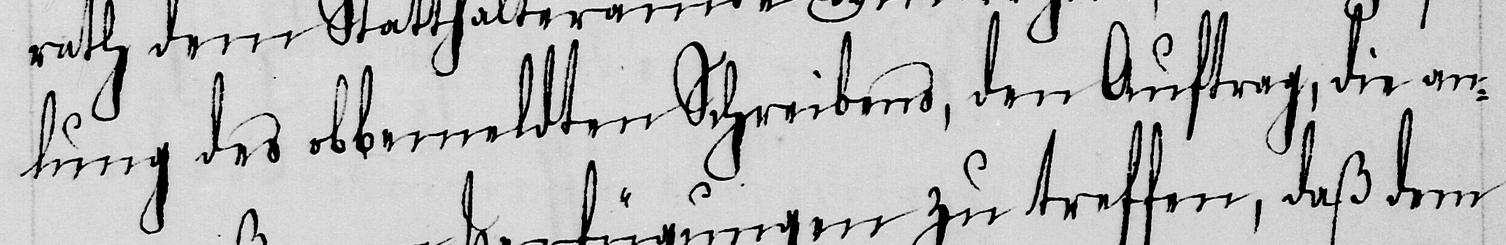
lung des obbemeldten Schreibens, den Auftrag, die an¬
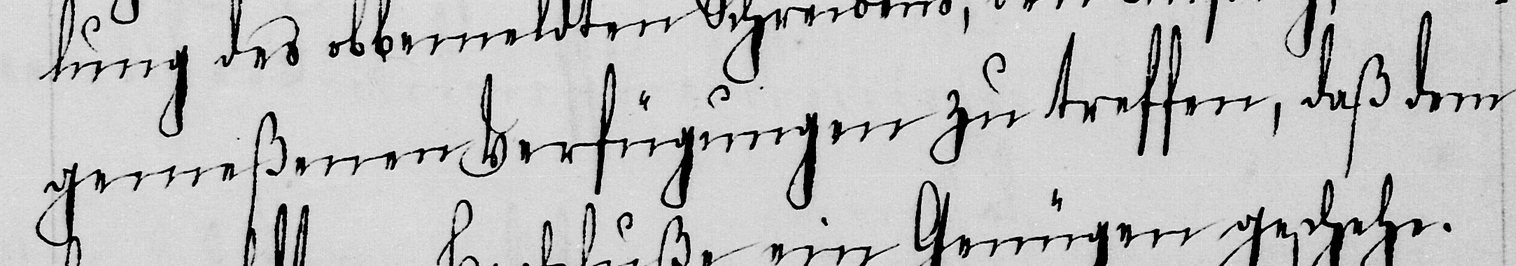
gemeßenen Verfügungen zu treffen, daß dem
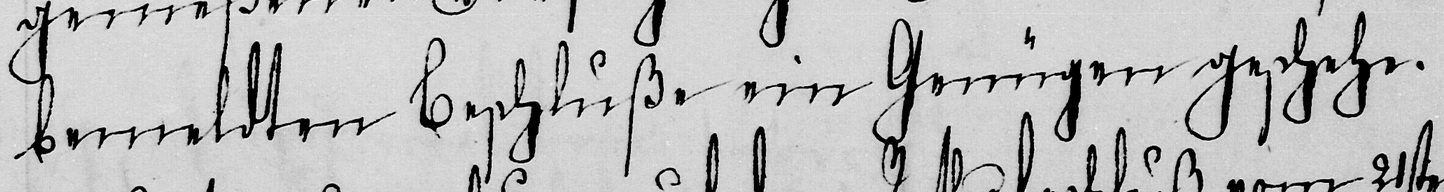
bemeldten Beschluße ein Genügen geschehe.
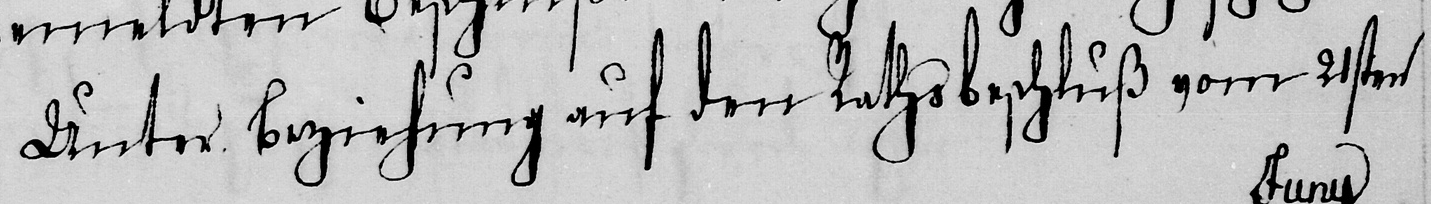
Unter Beziehung auf den Rathsbeschluß vom 21sten
